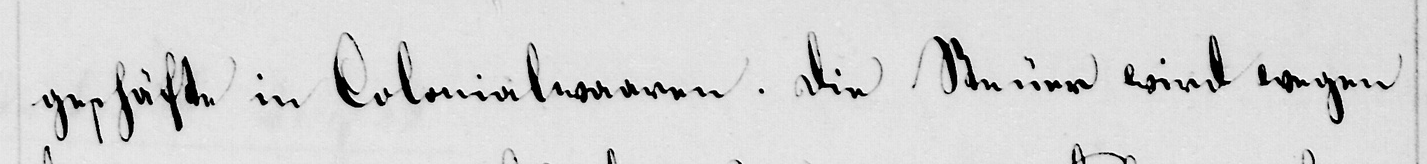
geschäfte in Colonialwaaren. Die Steuer wird wegen
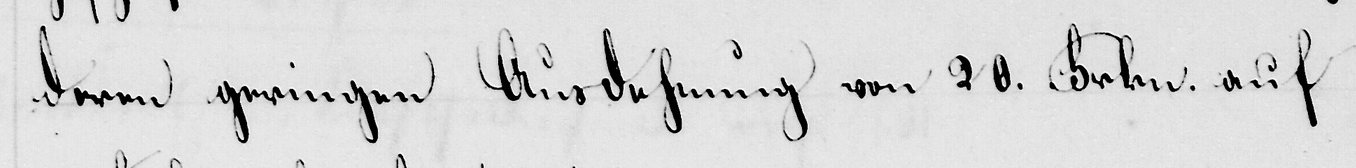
deren geringen Ausdehnung von 20. Frkn. auf
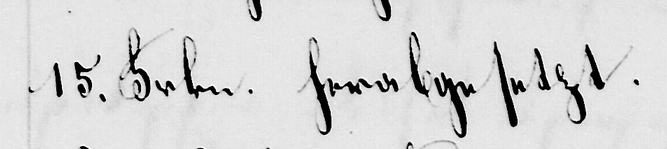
15. Frkn. herabgesetzt.
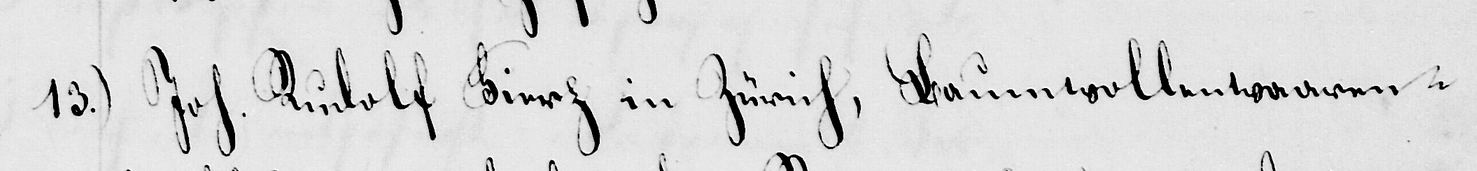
13.) Joh. Rudolf Fierz in Zürich, Baumwollenwaaren¬
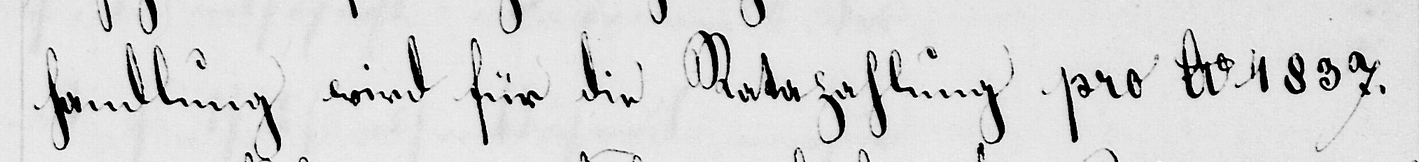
handlung wird für die Ratazahlung pro A°. 1837.
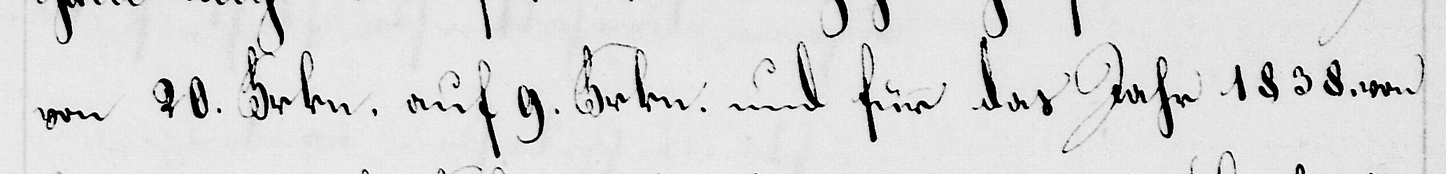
von 20. Frkn. auf 9. Frkn. und für das Jahr 1838. von
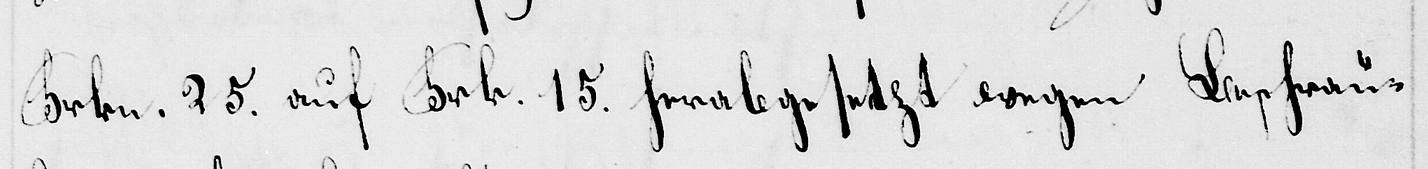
Frkn. 25. auf Frk. 15. herabgesetzt wegen Beschrän¬
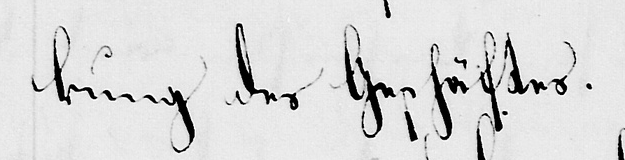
kung des Geschäftes.
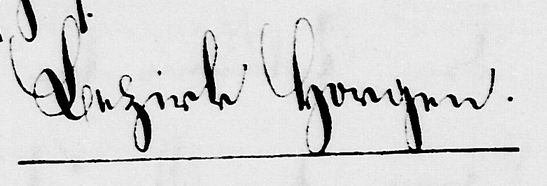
Bezirk Horgen.
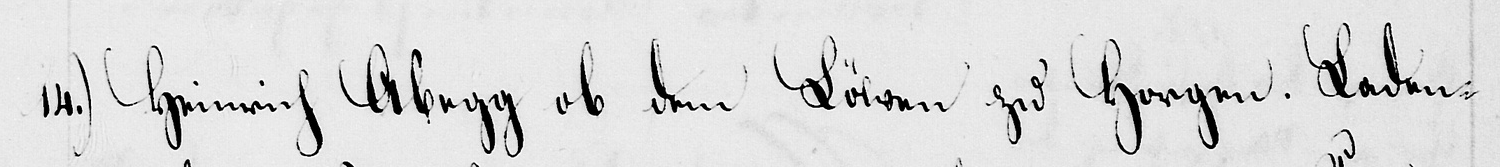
14.) Heinrich Abegg ob dem Löwen zu Horgen. Laden¬
